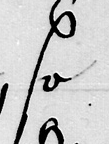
so
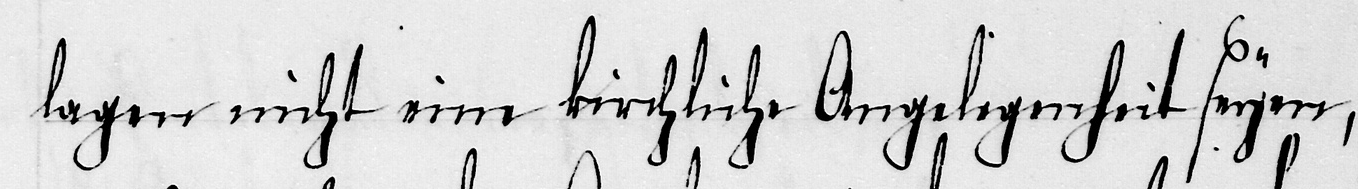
lagen nicht eine kirchliche Angelegenheit seyen,
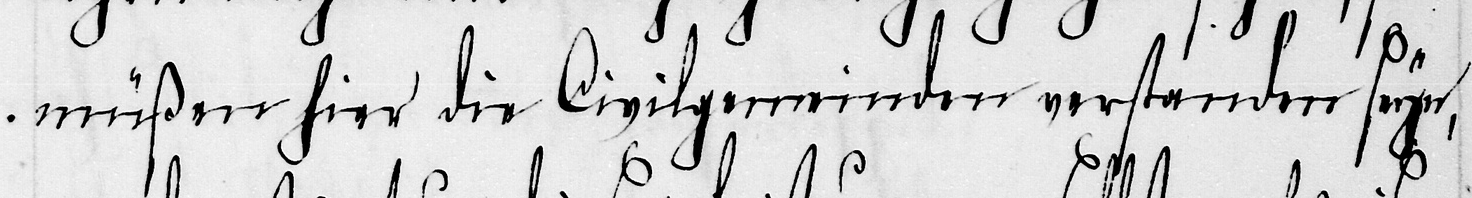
müßen hier die Civilgemeinden verstanden seyn,
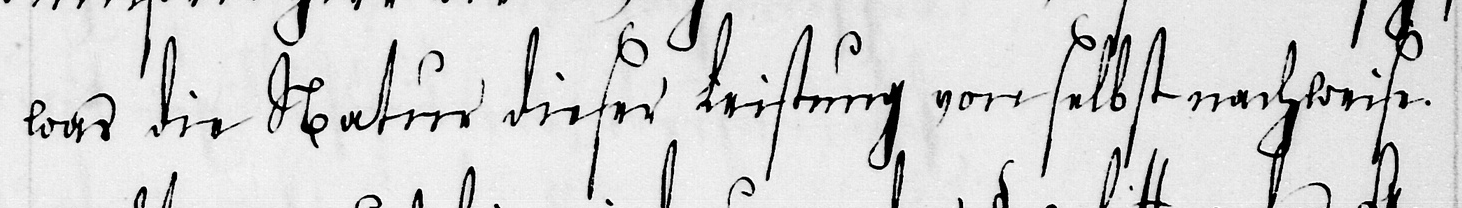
was die Natur dieser Leistung von selbst nachweise.
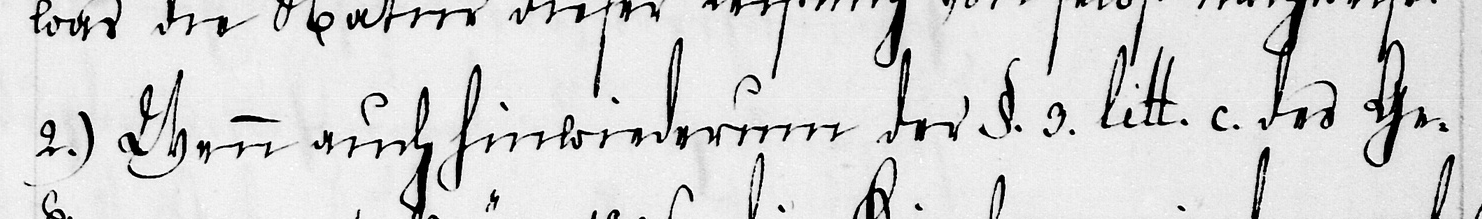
2.) Wenn auch hinwiederum der §. 3. litt. c. de¬
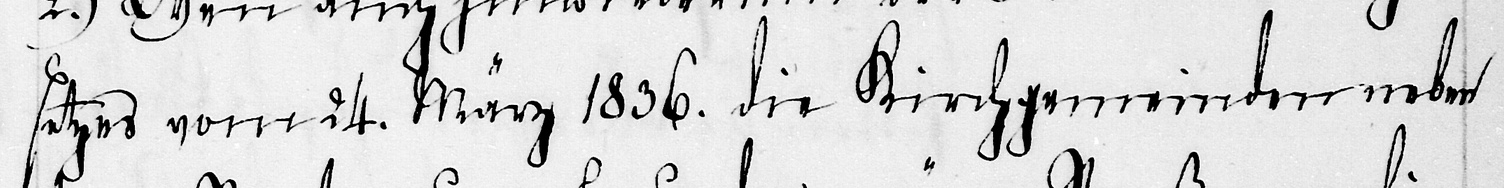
setzes vom 24. März 1836. die Kirchgemeinden neben
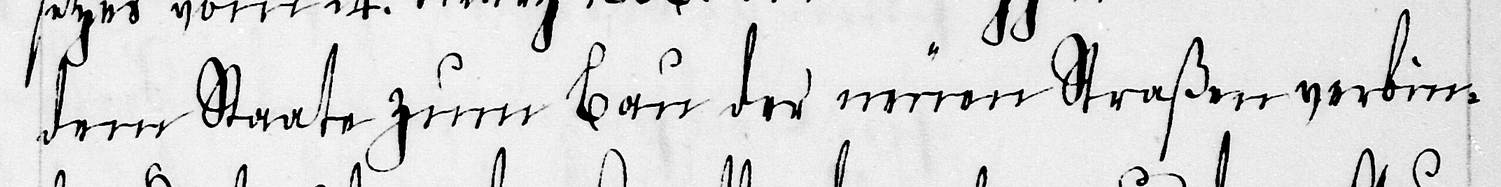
dem Staate zum Bau der neuen Straßen verbin¬
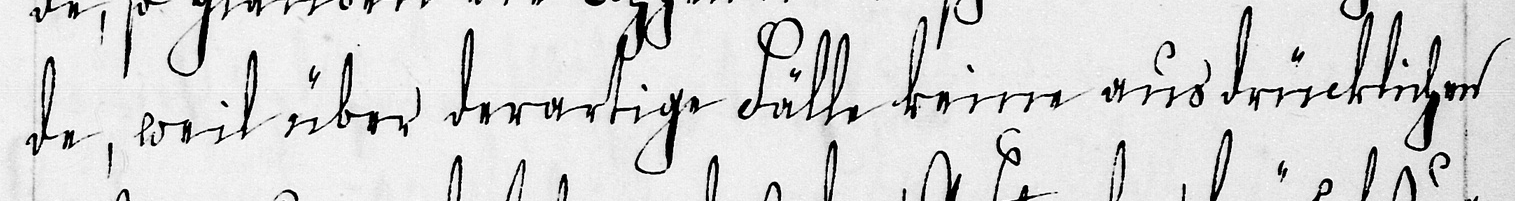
de, weil über derartige Fälle keine ausdrücklichen
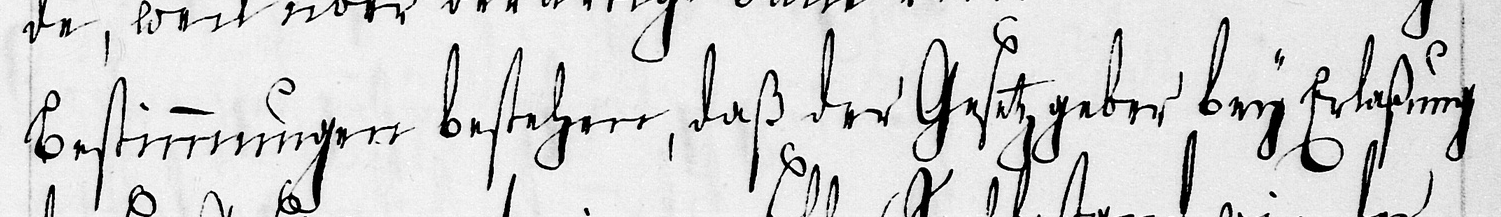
Bestimmungen bestehen, daß der Gesetzgeber bey Erlaßung
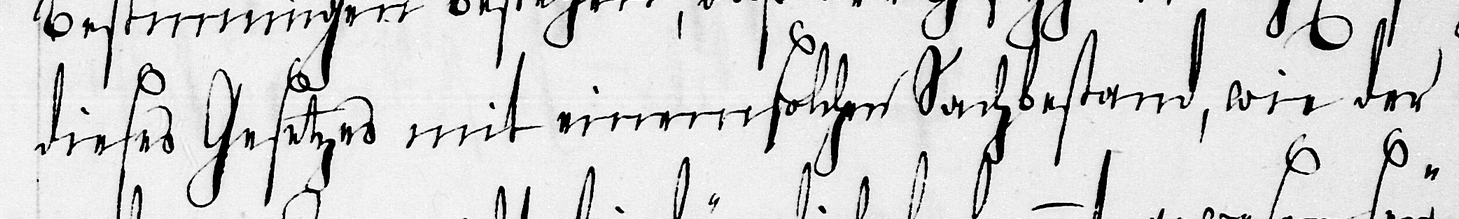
dieses Gesetzes mit einem solchen Sachbestand, wie der
